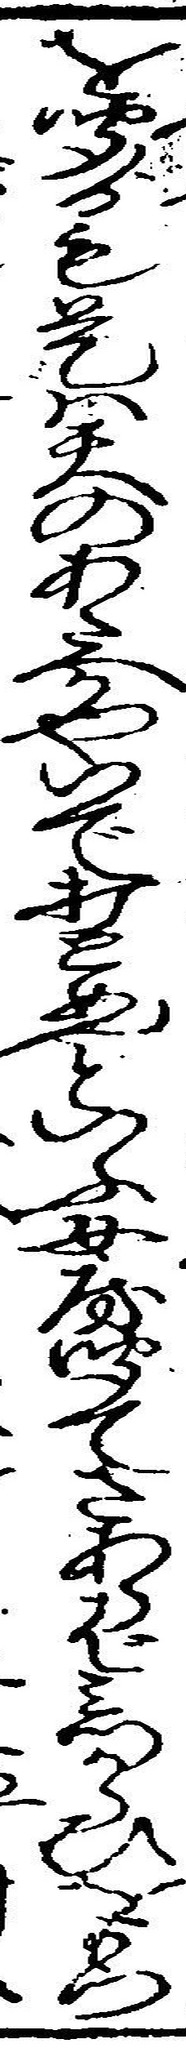を聞ゟも是は天のあたへかやいで打とめんといふ女房聞てさらばみつからひをもつ
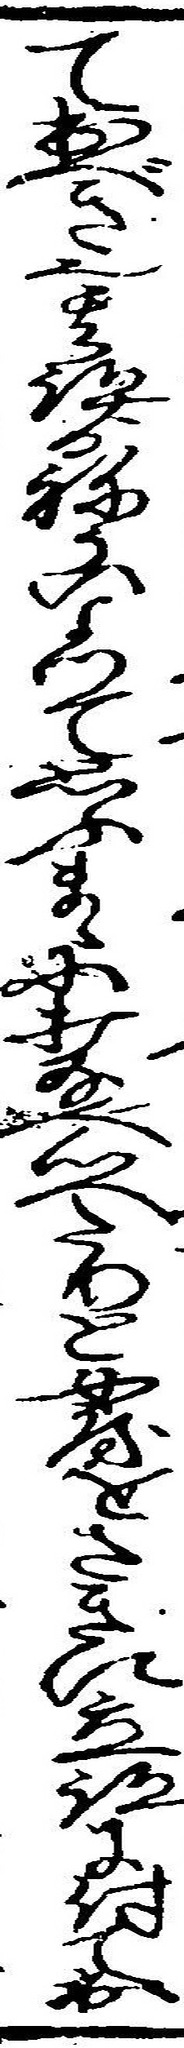て出べき也其跡ゟねかいよつて思ふまゝに打給へ心へたりと女房をさきに立後に付て出
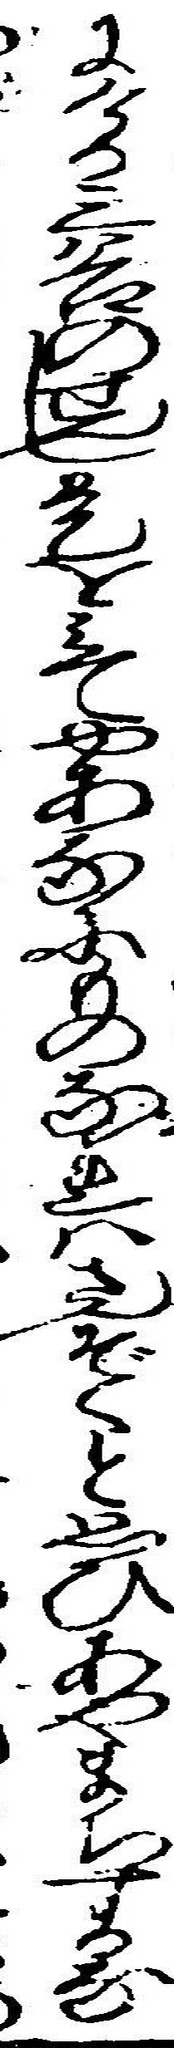にける三谷のせんし是をみてやあなにものなれはさんぞくと思ひあやまちするな
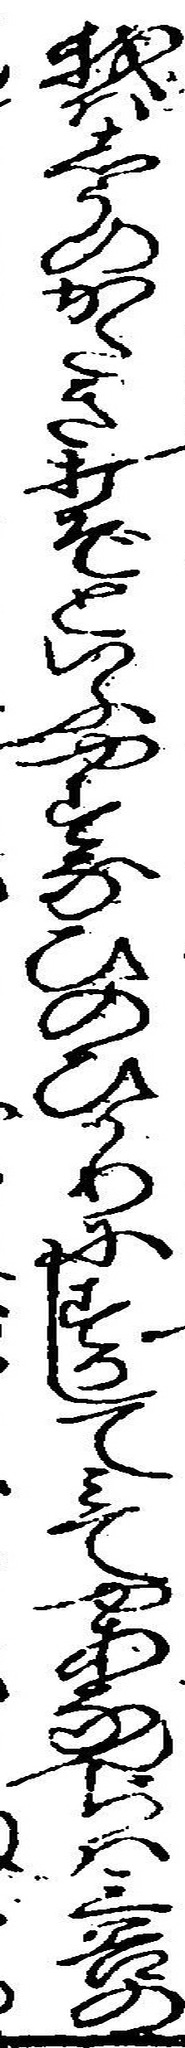我はしうのかたき打ぞといふやすなひのひかりにすかしてみてやあなんぢは三谷の
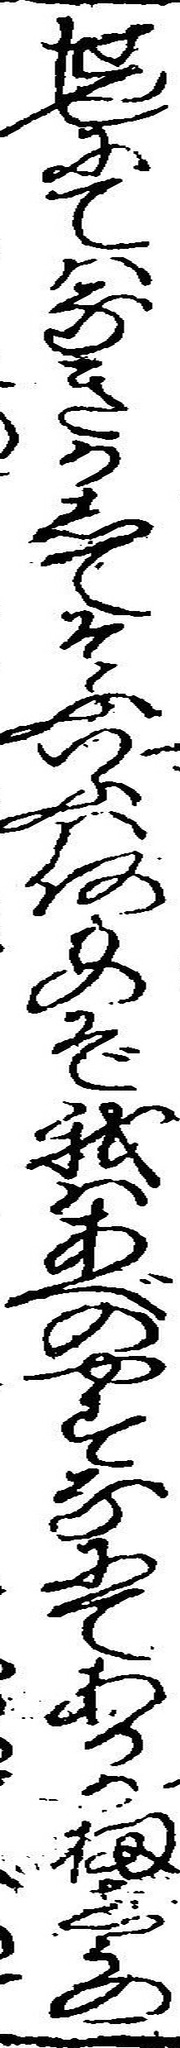せんしにてはなきかしてそふいふは何ものぞ我はあべのやすなにてあるか扨しうの
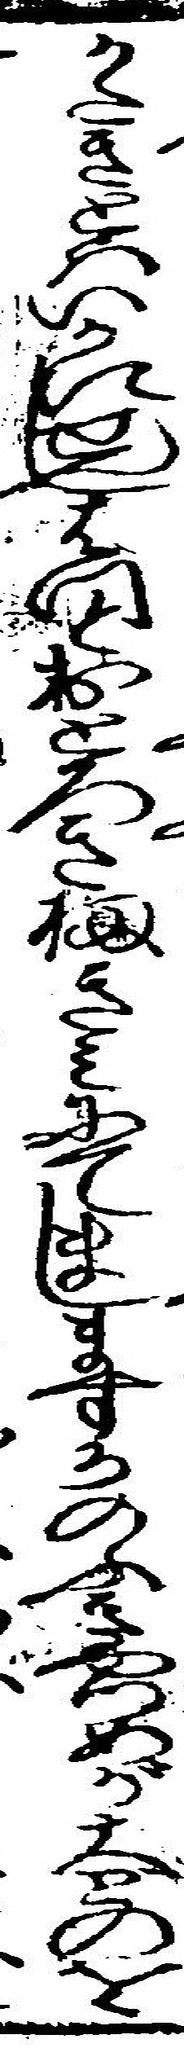かたきとはいかにせんしはつとおとろき扨きみにてましますかのふきやつめが大とのを
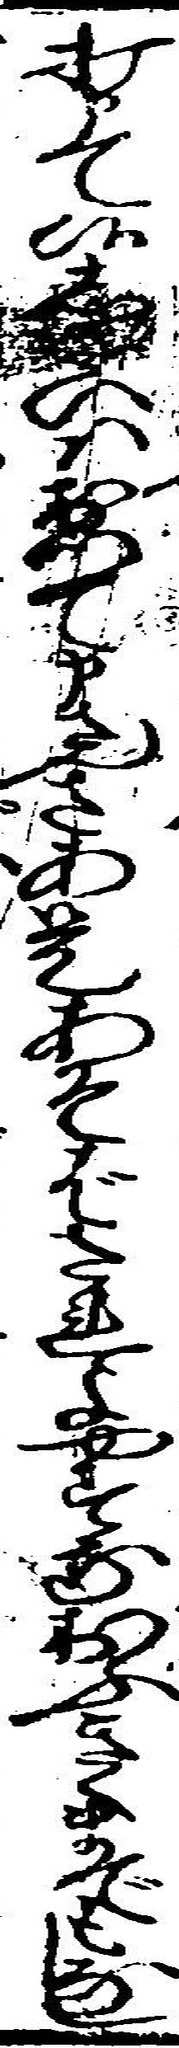打申て候しやいはおつて申さんさあ是あそばされよやすなおふきくまでもなし
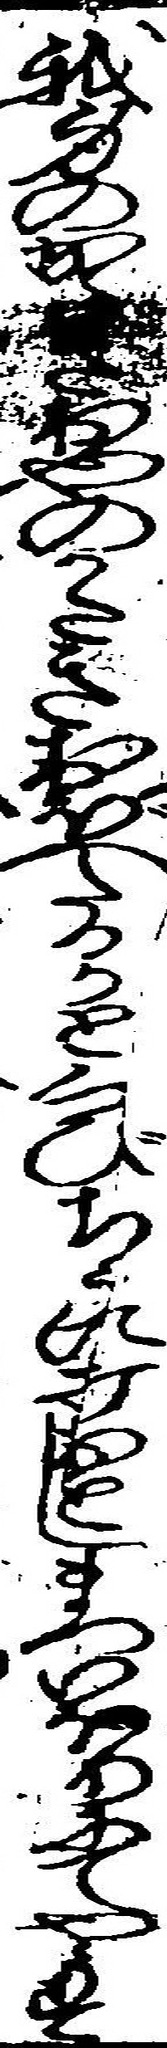我身のかたきおやのかたきおぼへたるかとくびちうに打おとしまついほりにてやうす
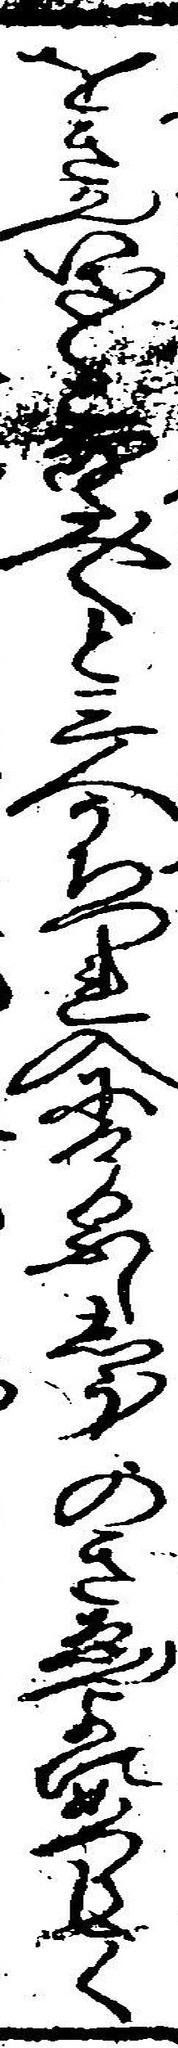をきかんいさ〳〵こなたへ〳〵と三人うちつれ入にけるふししう〳〵のきゑんよにめつらしく
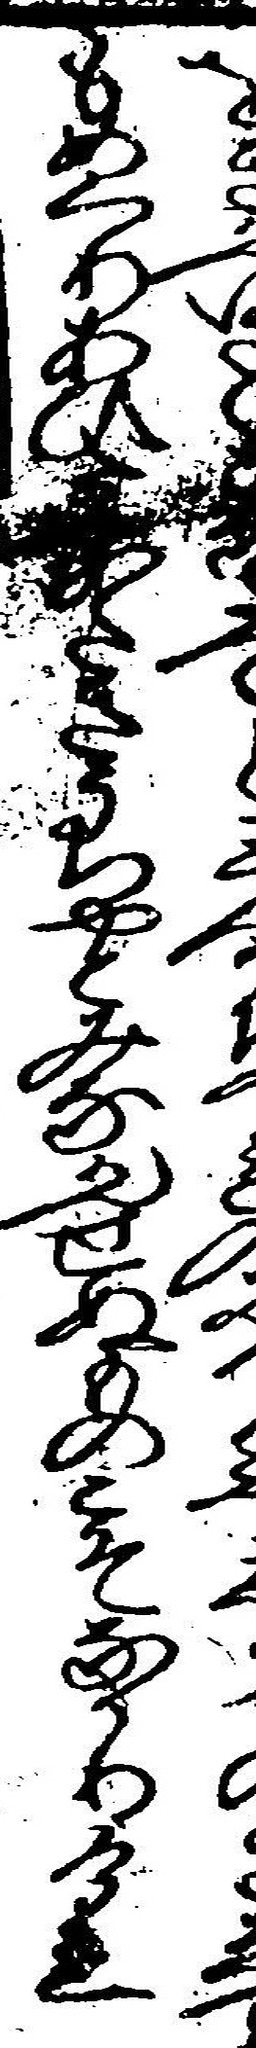もめくりあひかたきうちやとみなかんせぬものこそなりけれ
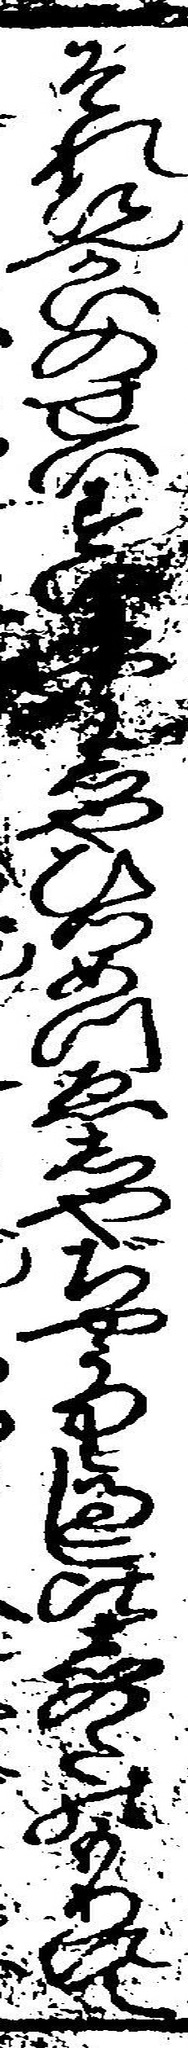それにんかいのせいすいしやうしやひつめつゑしやじやうりへし此しのたのもりにて
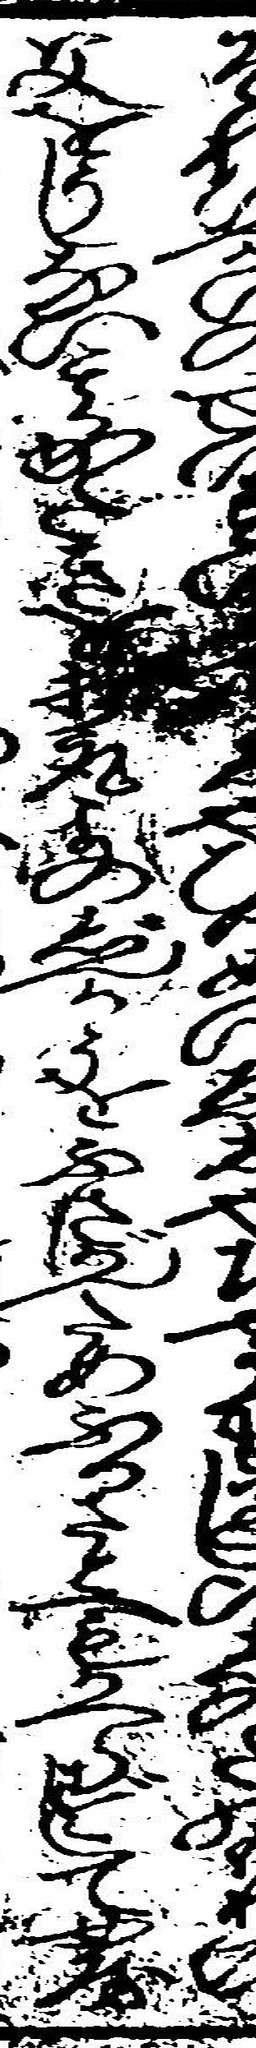父をうしない其かたきを打取よのじんかうをふさがんためふるさとへもかへらずして女房
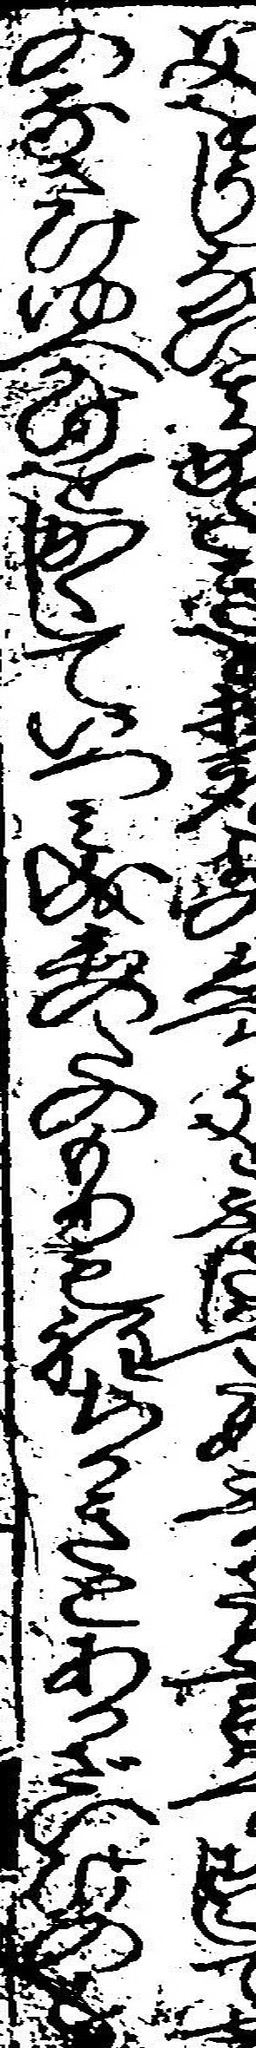のなさけゆへかけをかくしていつみ成しのたのもりも程ちかきとあるざいけのと

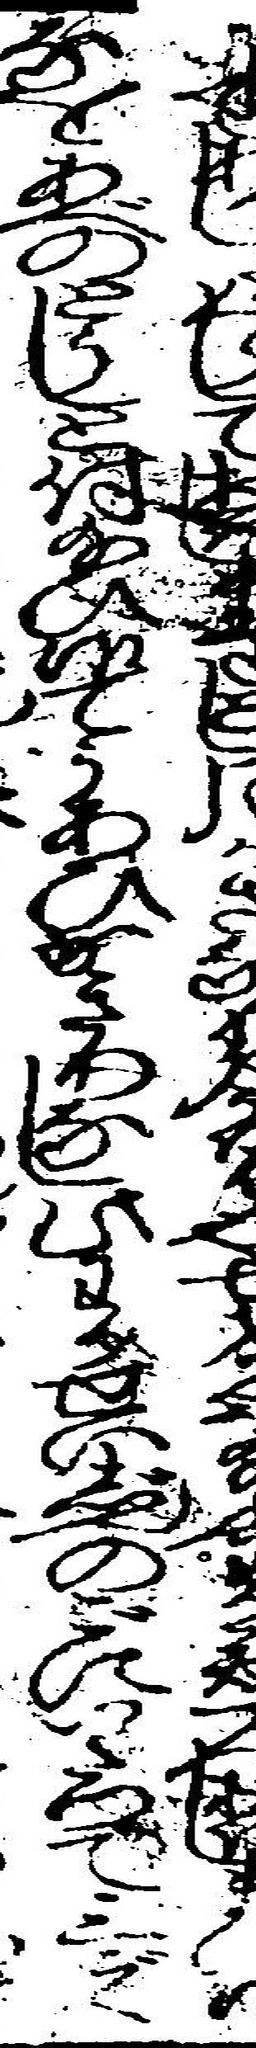なをあべのとうしと付給ひ御てうあいかきりなし此わかせいじんのごにいたつて三ごく
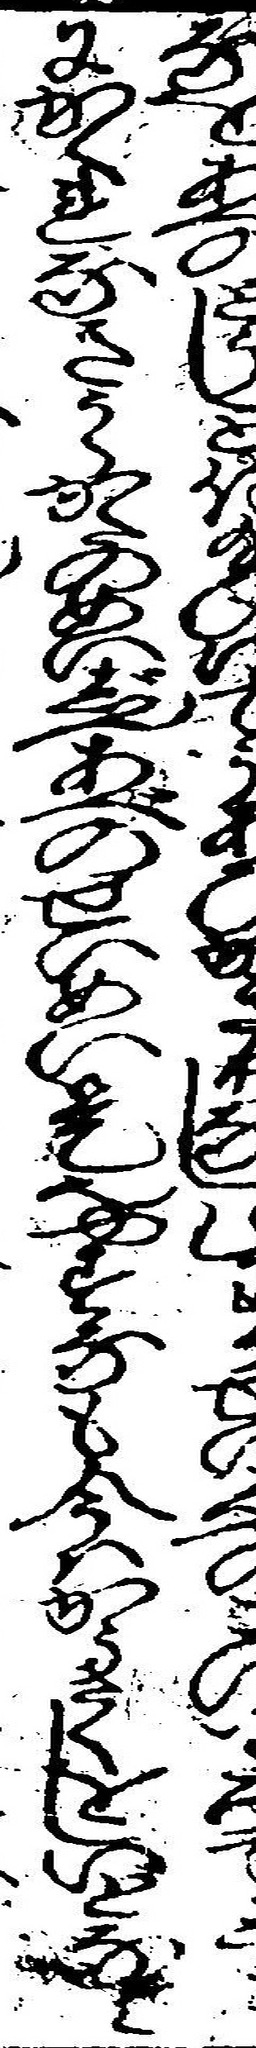にかくれなきうらかたのめいじんあべのせいめい是也やすなも今はかうさくをしいとなみ
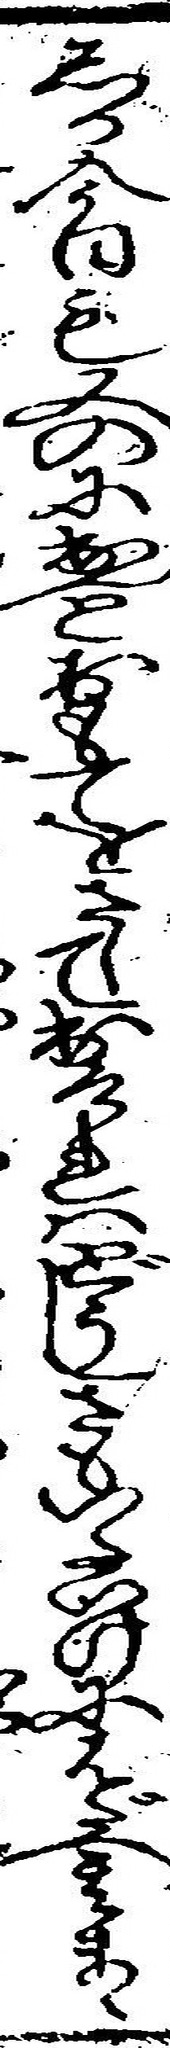しか今日も又のに出んとおもてをさして出けれはどうしさもいたいけにはだへ其まゝ
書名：[しのだづまつりぎつね付あべの清明出生]
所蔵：東京大学総合図書館 General Library in the University of Tokyo, JAPAN
